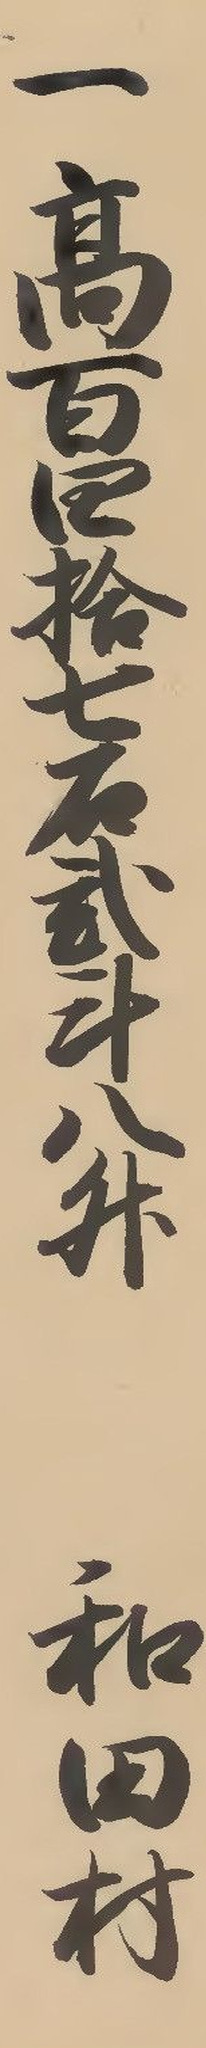一高百四拾七石弐斗八升和田村
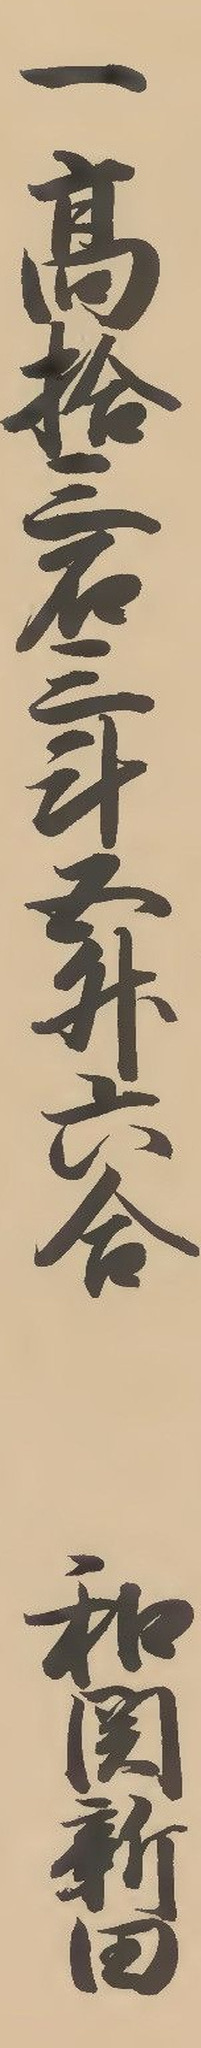一高拾三石三斗五升六合和関新田
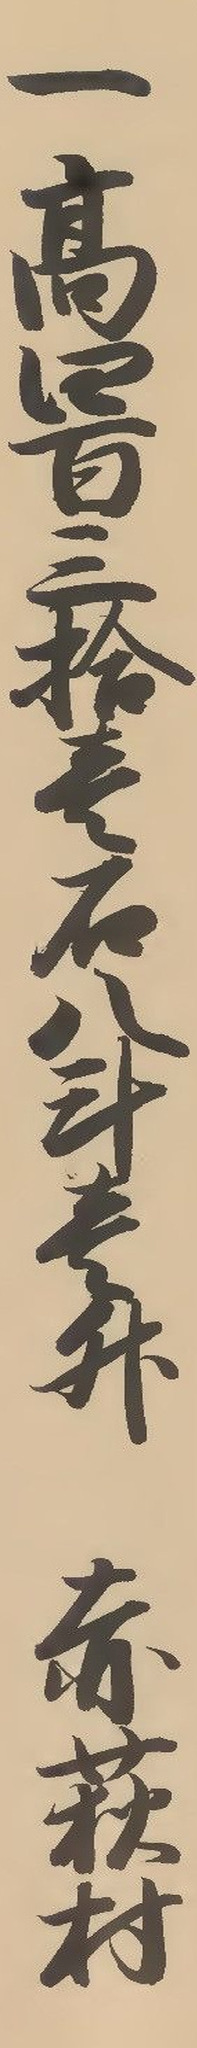一高四百三拾壱石八斗壱升赤萩村
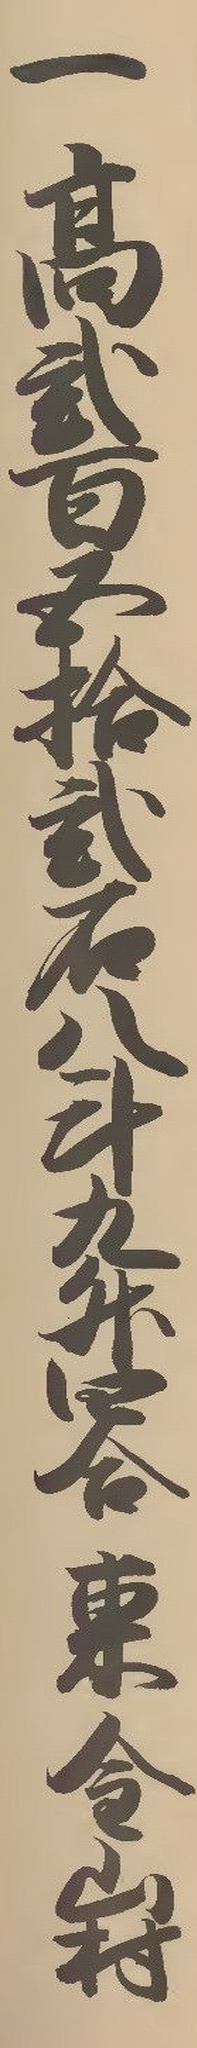一高弐百五拾弐石八斗九升四合東金山村
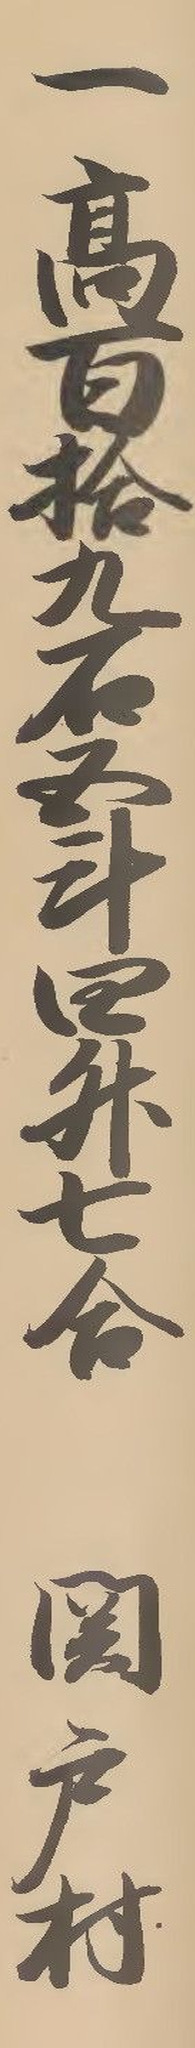一高百拾九石五斗四升七合関戸村
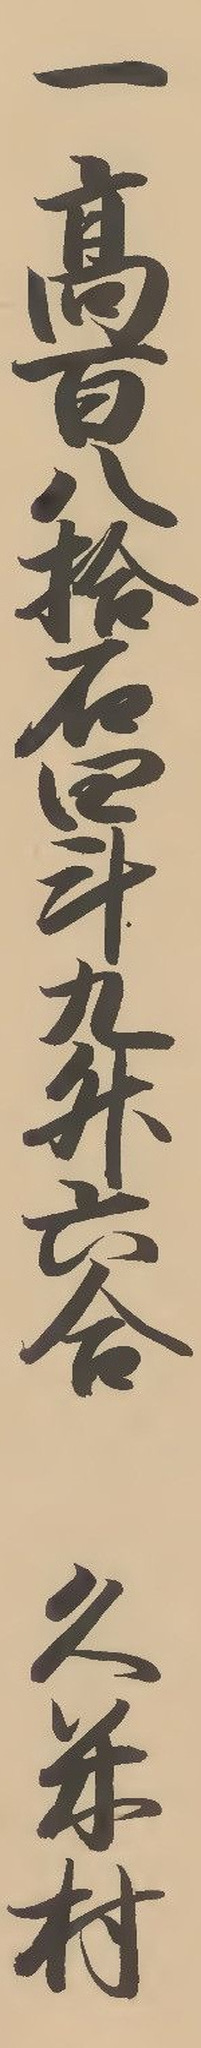一高百八拾石四斗九升六合久米村
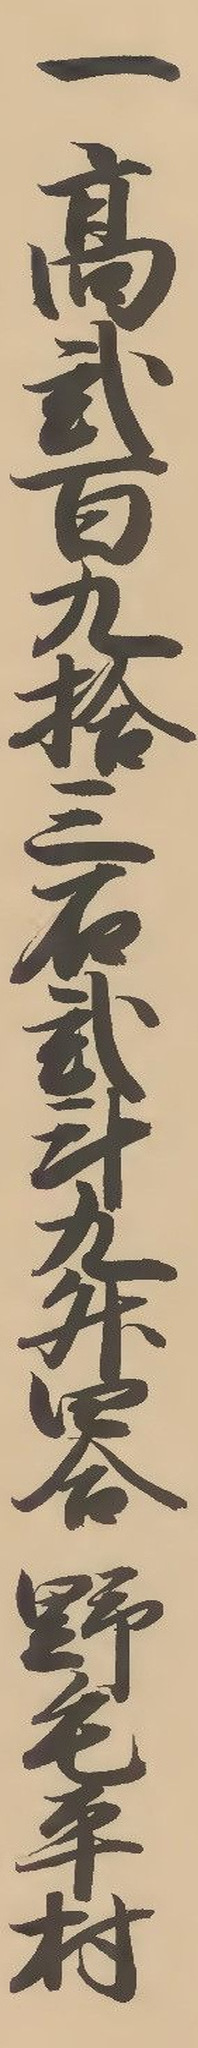一高弐百九拾三石弐斗九升四合野毛平村
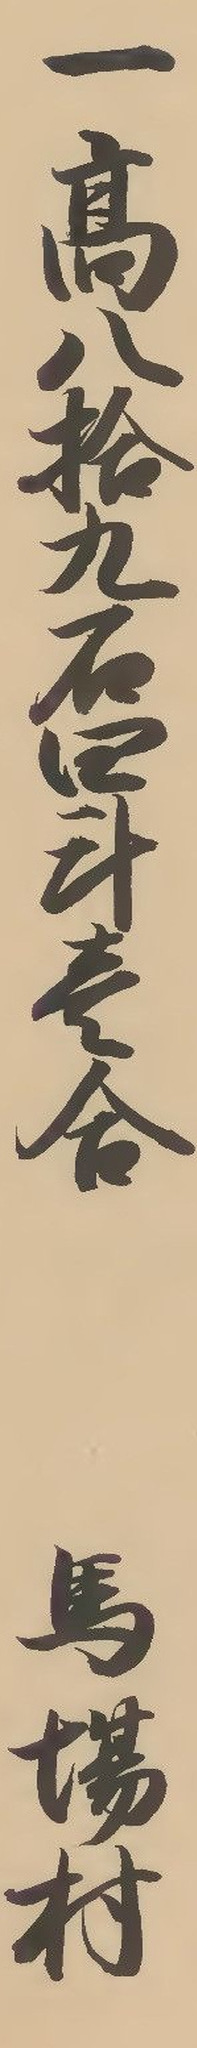一高八拾九石四斗壱合馬場村

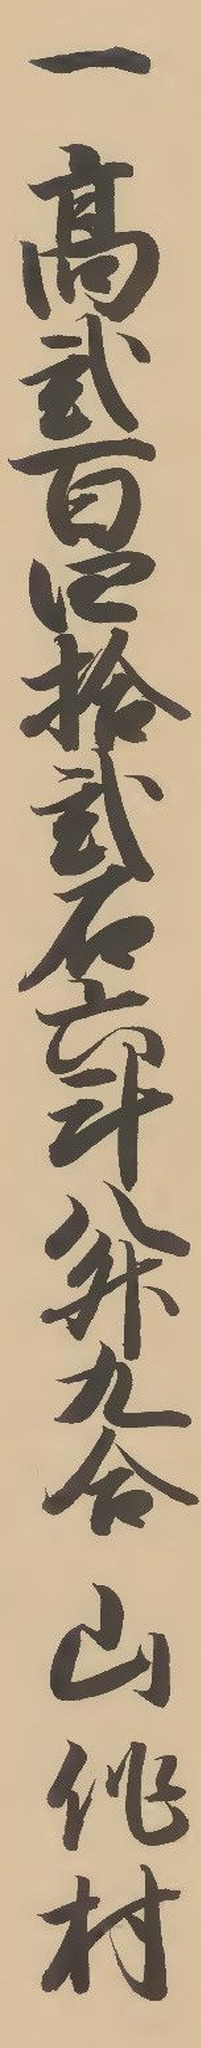一高弐百四拾弐石六斗八升九合山作村
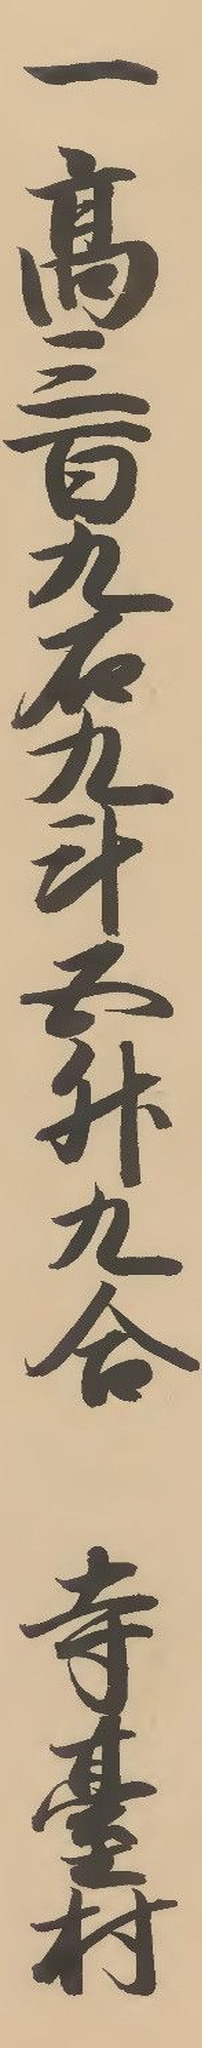一高三百九石九斗五升九合寺台村
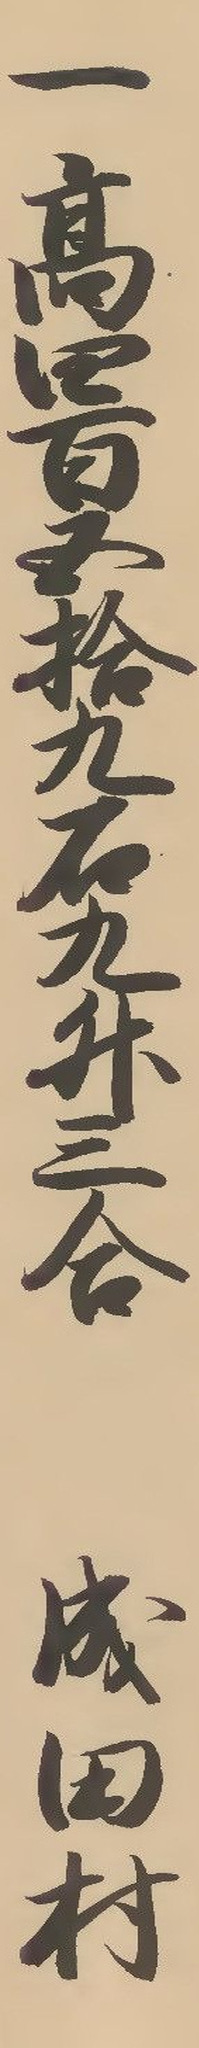一高四百五拾九石九升三合成田村
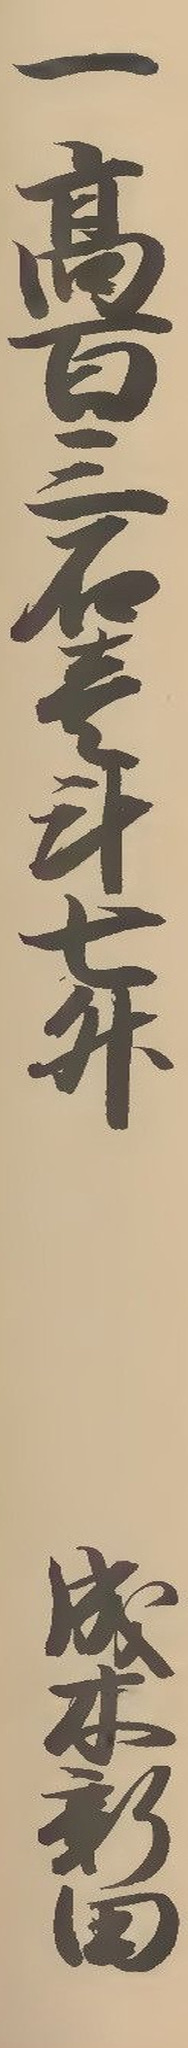一高百三石壱斗七升成木新田
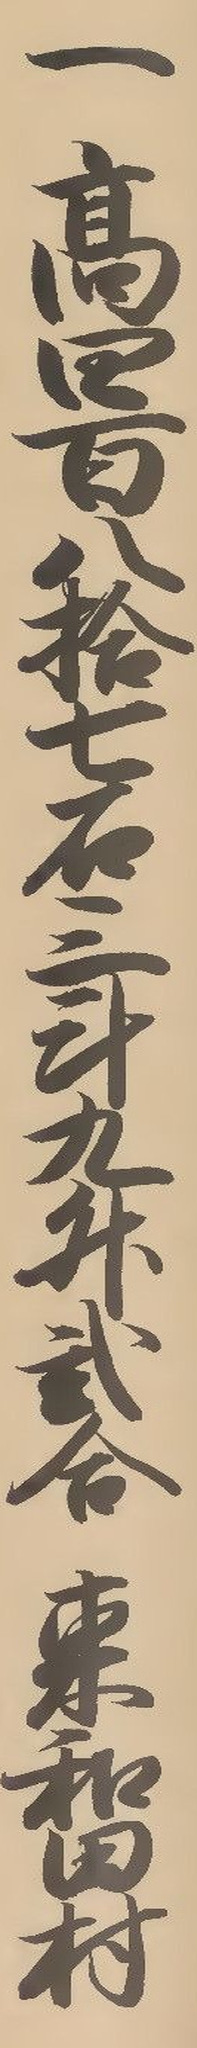一高四百八拾七石三斗九升弐合東和田村
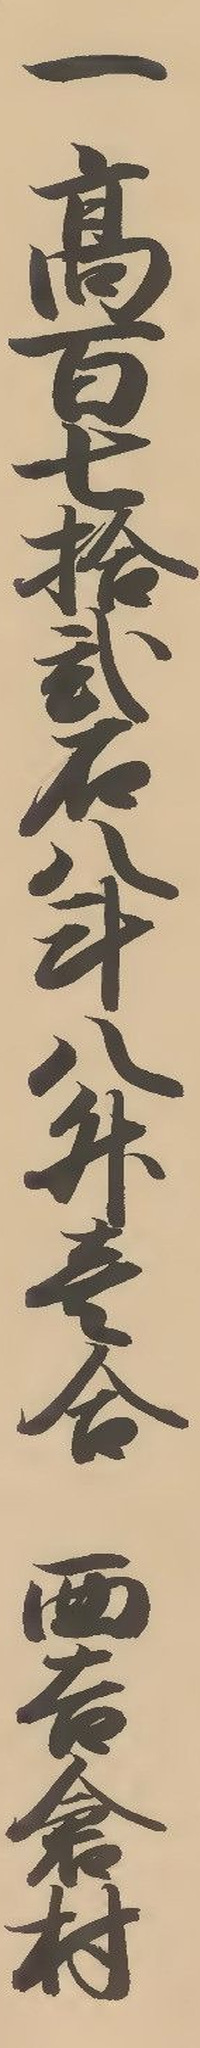一高百七拾弐石八斗八升壱合西吉倉村
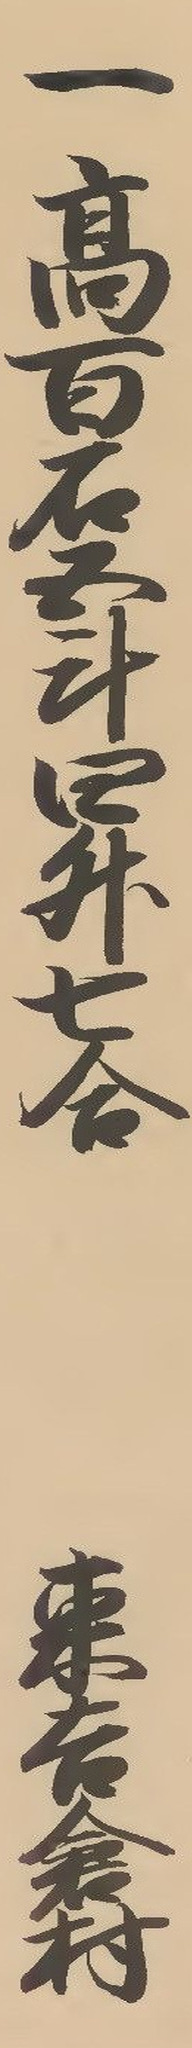一高百石五斗四升七合東吉倉村
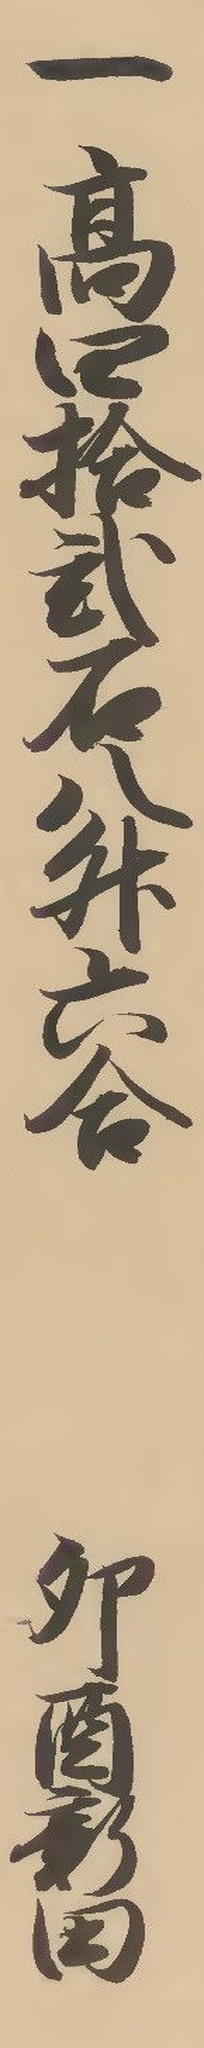一高四拾弐石八升六合卯酉新田
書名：下総国郷帳
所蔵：国立公文書館 National Archives of Japan
